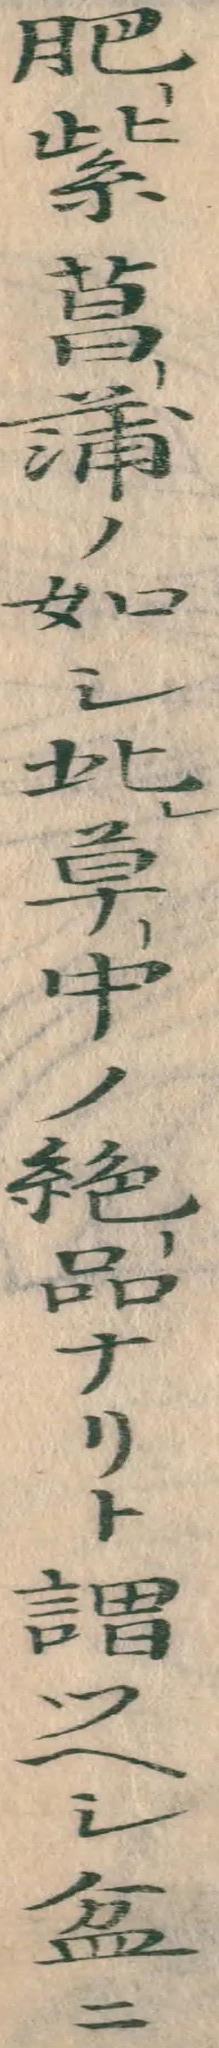肥-紫菖-蒲ノ如シ此草-中ノ絶-品ナリト謂ツヘシ盆ニ
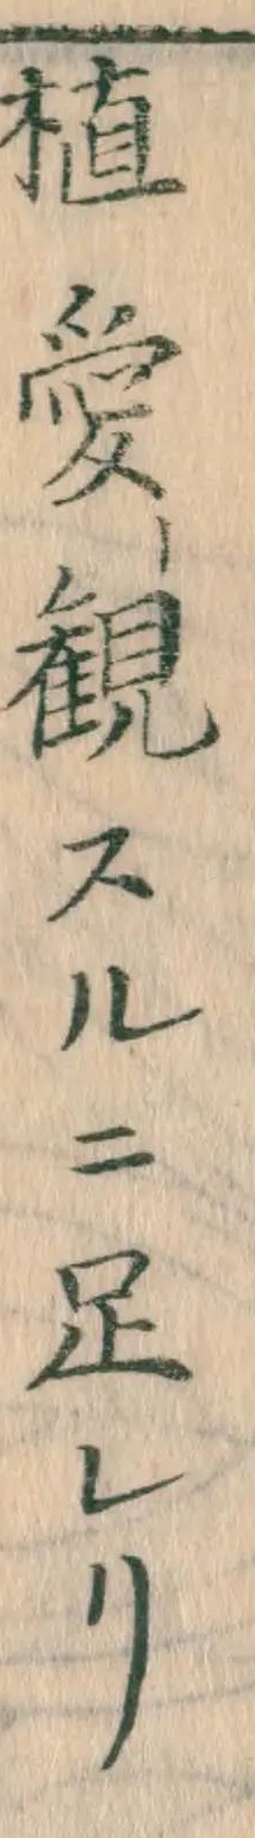植愛-観スルニ足レリ

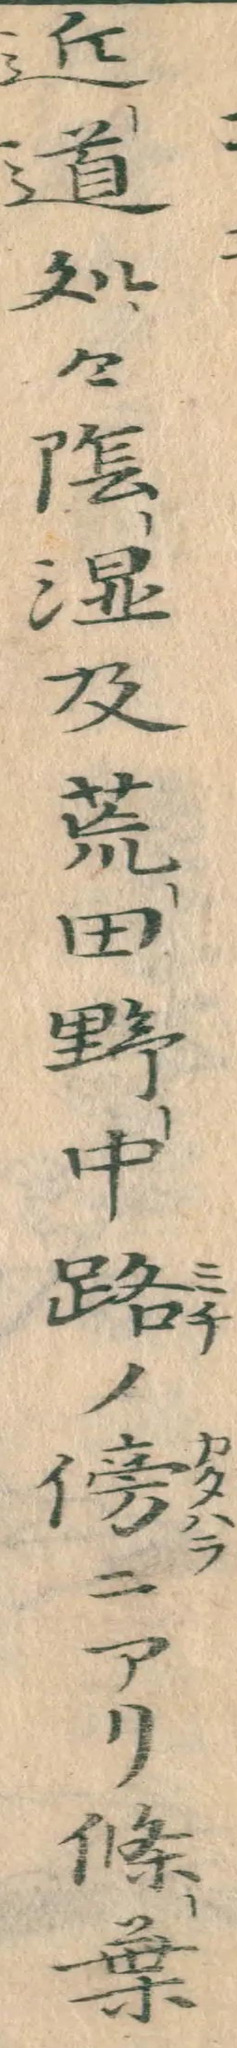近-道処-々陰-湿及荒-田野-中路ノ傍ニアリ条-葉
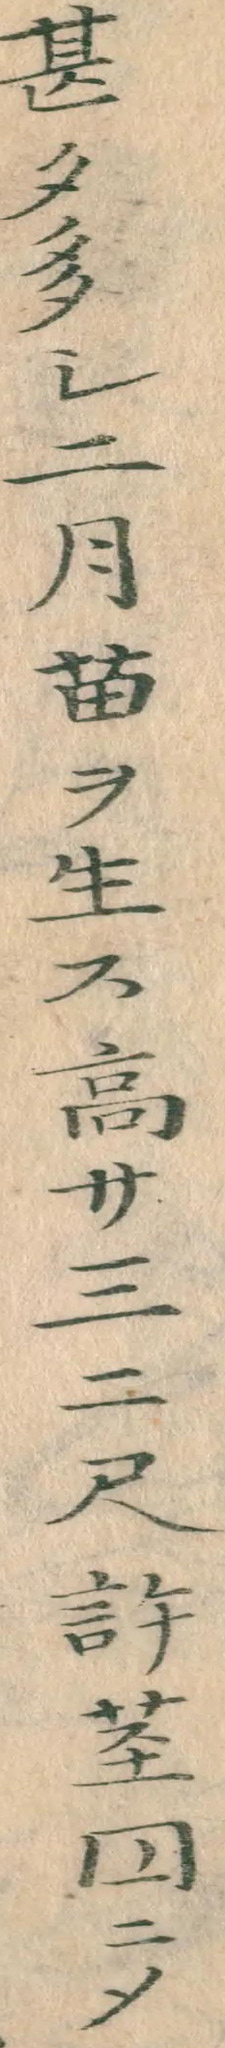甚タ多シ二月苗ヲ生ス高サ三二尺許茎円ニシテ
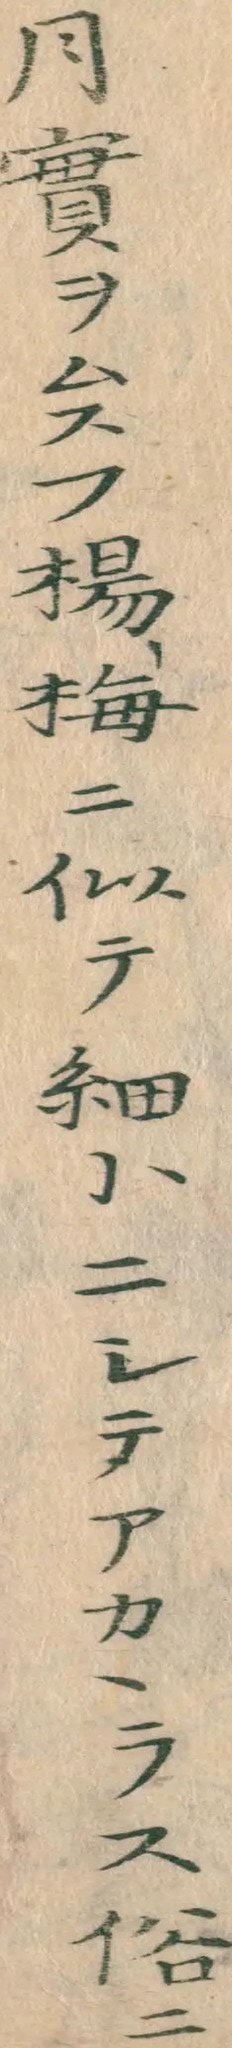月実ヲムスフ楊-梅ニ似テ細ニシテアカヽラス俗ニ
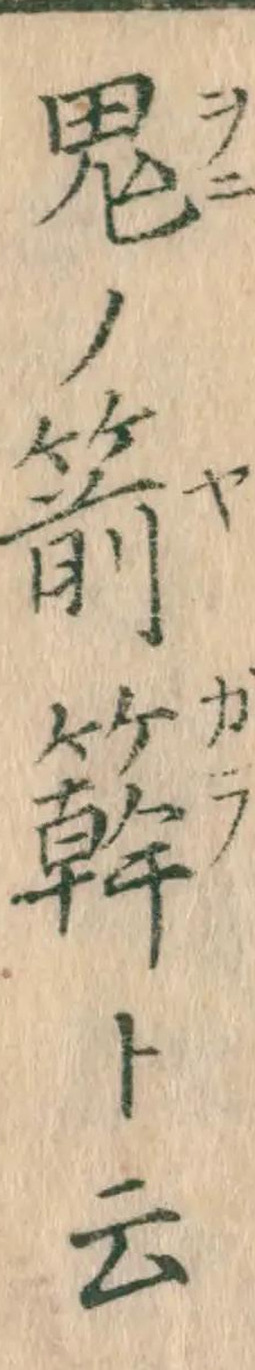鬼ノ箭簳ト云

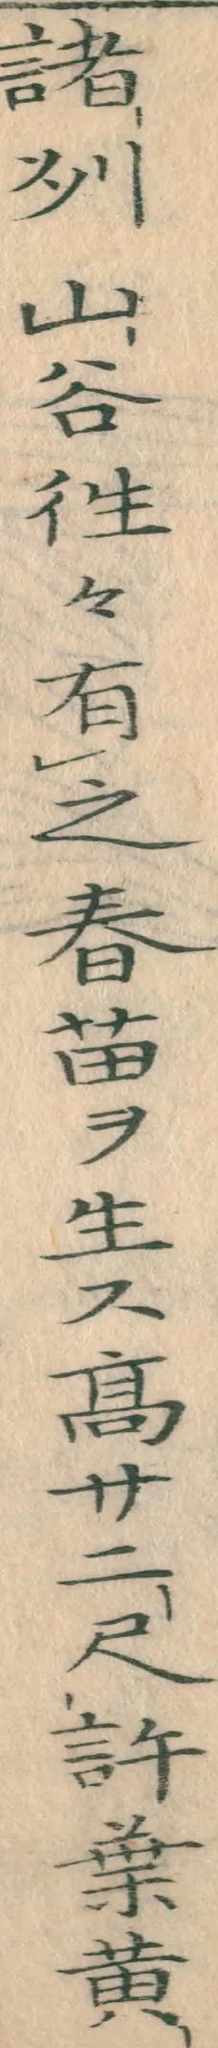諸-州山-谷往々有之春苗ヲ生ス高サ二-尺-許葉黄-
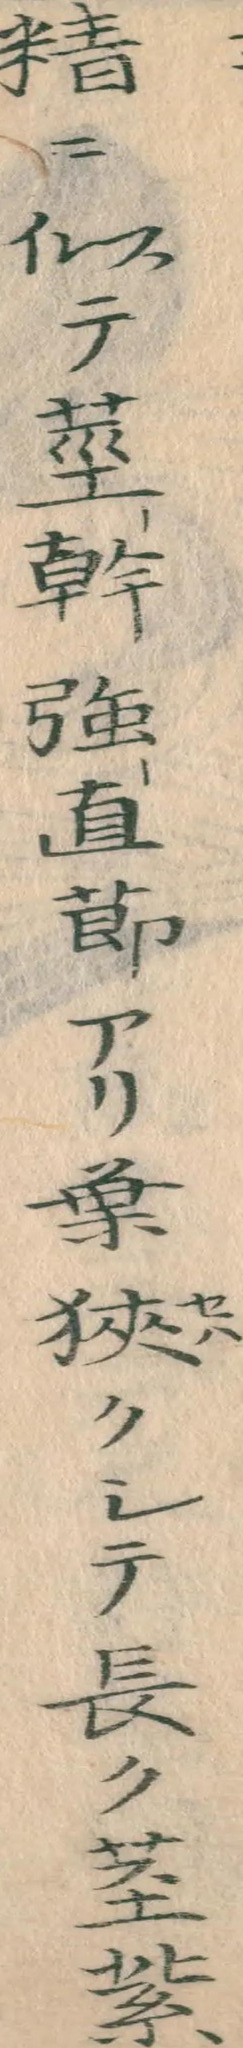精ニ似テ茎-幹強-直節アリ葉狭クシテ長ク茎紫
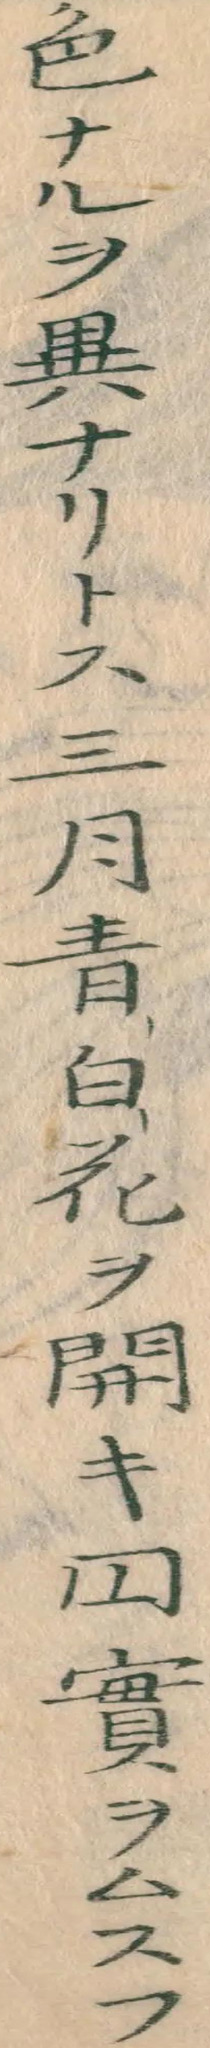色ナルヲ異ナリトス三月青-白-花ヲ開キ円実ヲムスフ
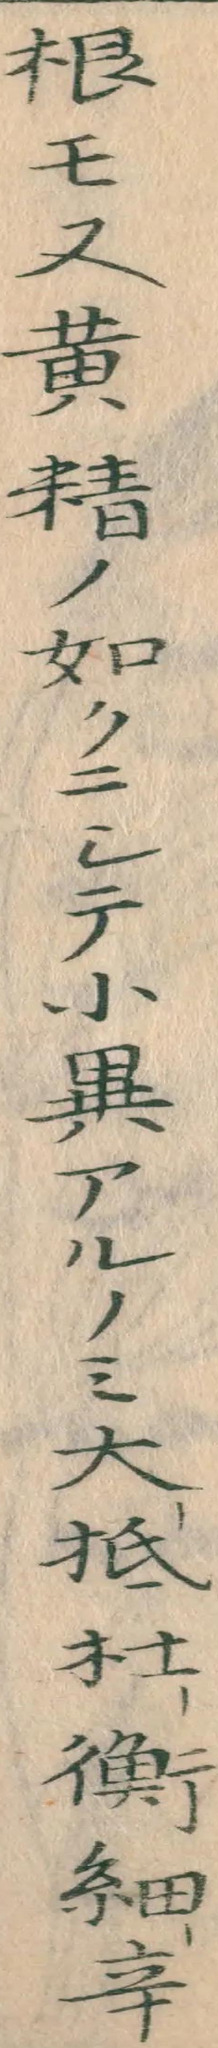根モ又黄精ノ如クニシテ小異アルノミ大-抵杜-衡細-辛

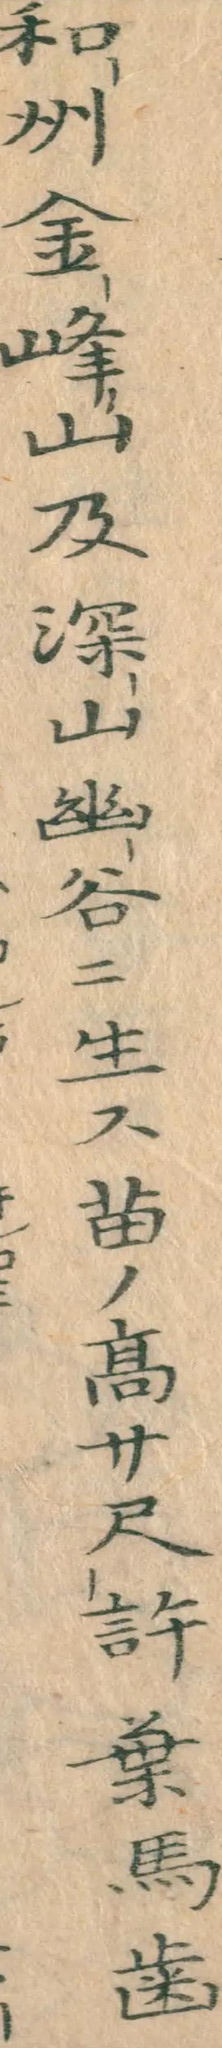和-州金-峰-山及深-山幽-谷ニ生ス苗ノ高サ尺-許葉馬歯
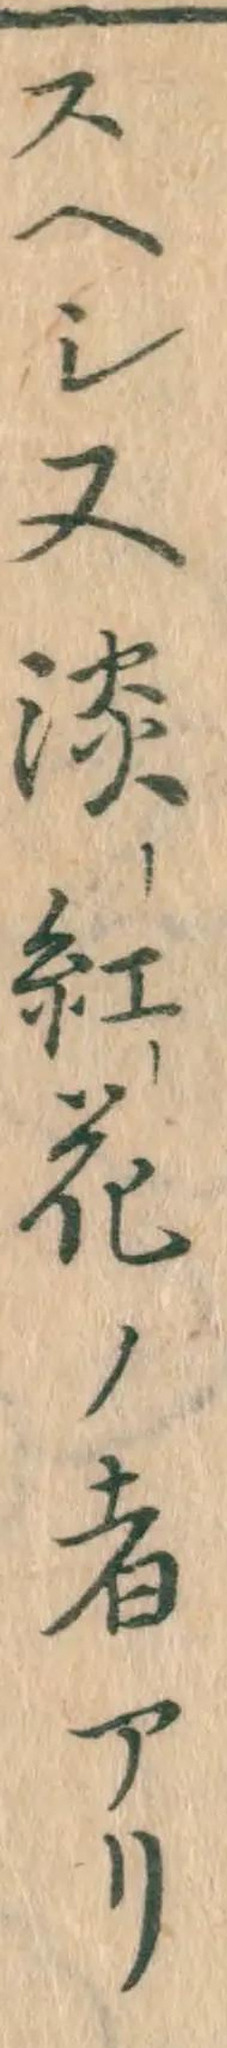スヘシ又淡-紅-花ノ者アリ

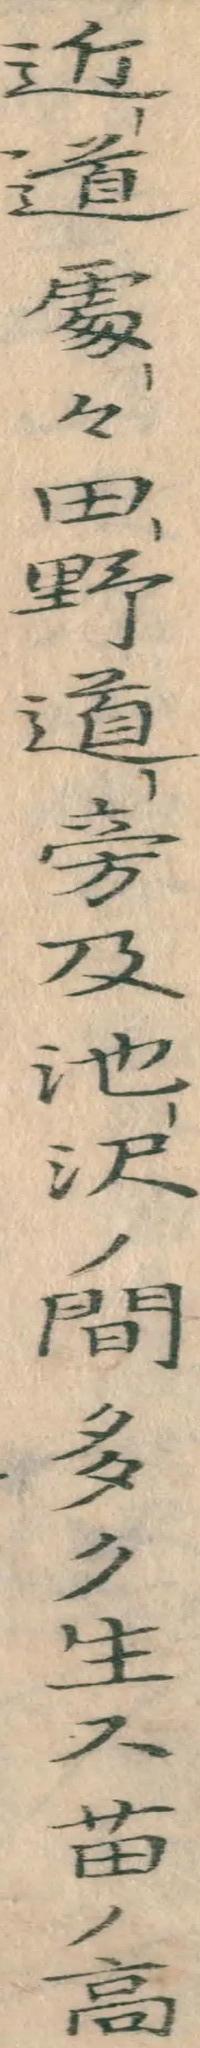近-道処-々田-野道-旁及池-沢ノ間多ク生ス苗ノ高
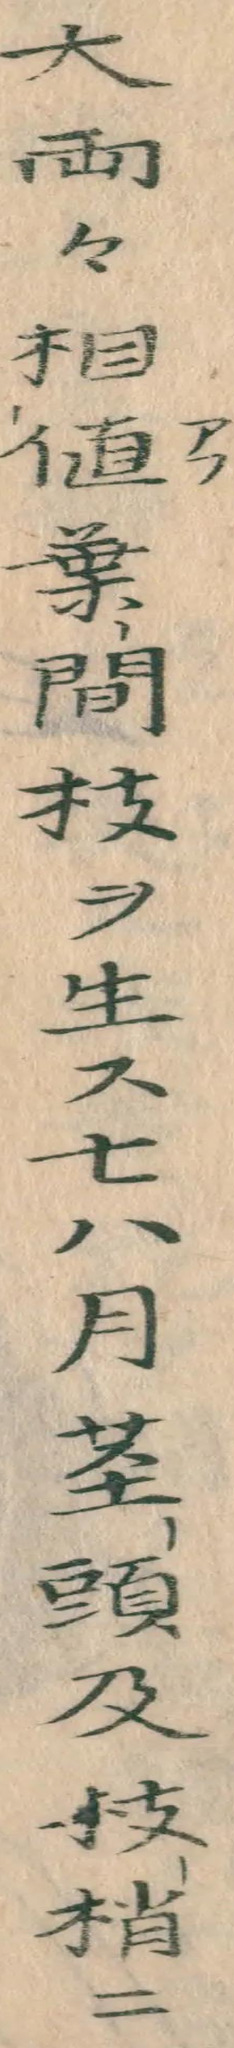大両々相-値葉-間枝ヲ生ス七八月茎-頭及枝-梢ニ
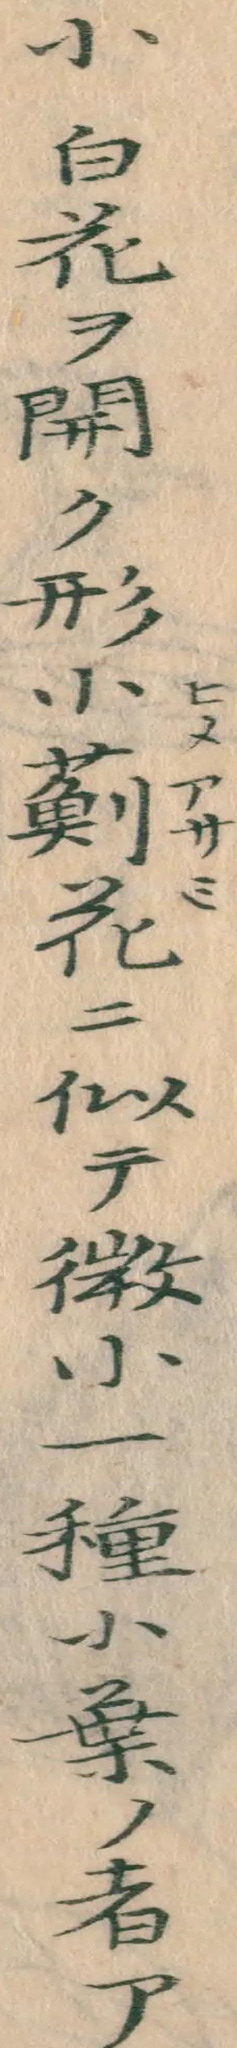小白花ヲ開ク形小薊花ニ似テ微小一種小葉ノ者ア
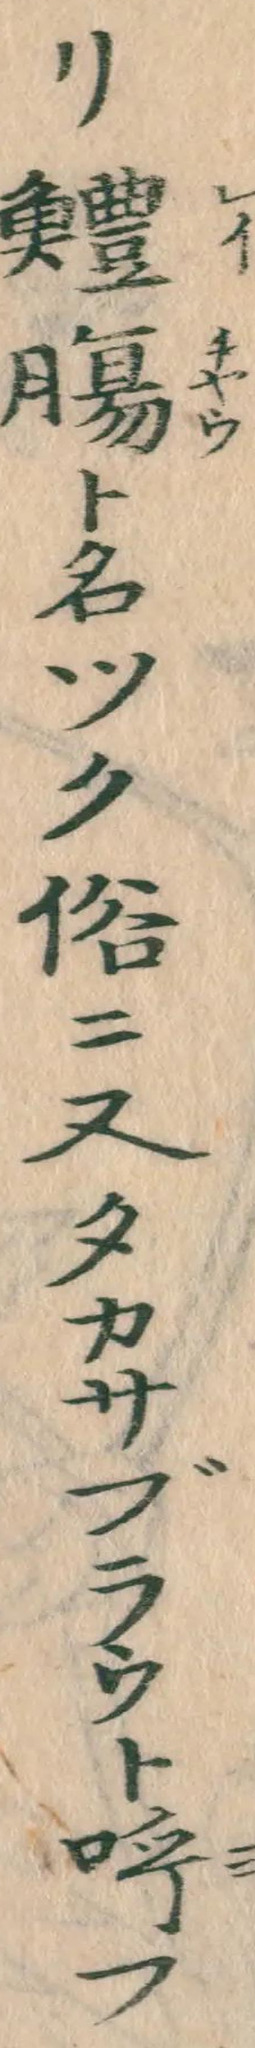リ鱧腸ト名ツク俗ニ又タカサブラウト呼フ
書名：花彙 草部4巻木部4巻. [1]
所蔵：国立国会図書館 National Diet Library, JAPAN
